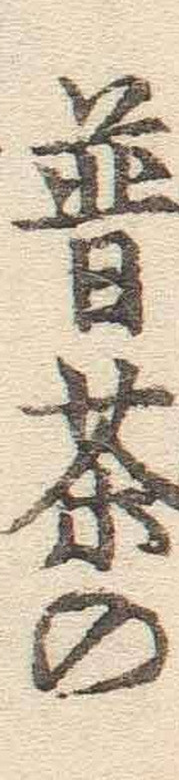普茶の
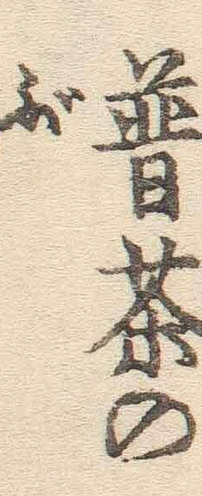普茶の
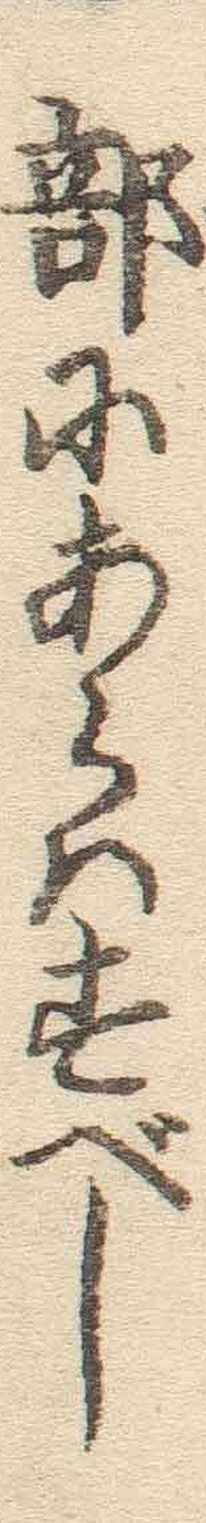部にあらはすべし

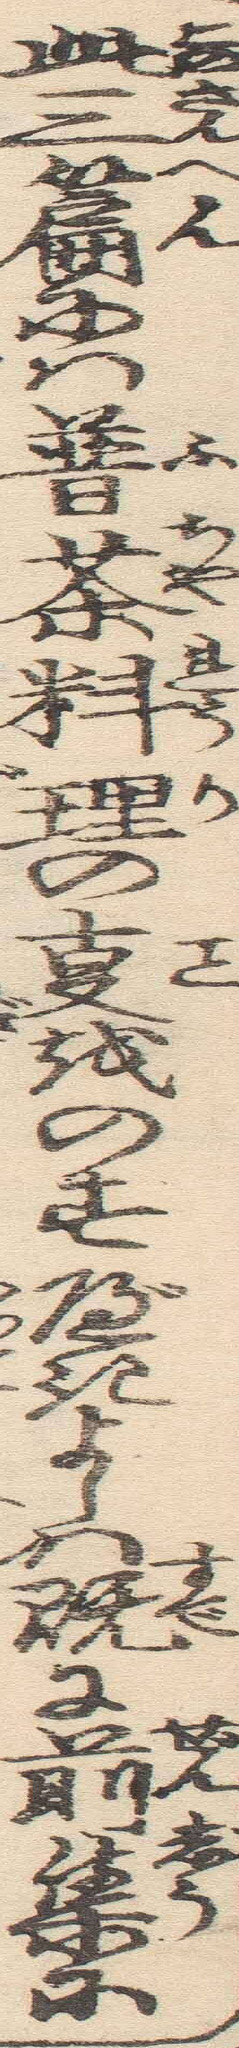此三篇には普茶料理の事をのすべきよしは既に前集に
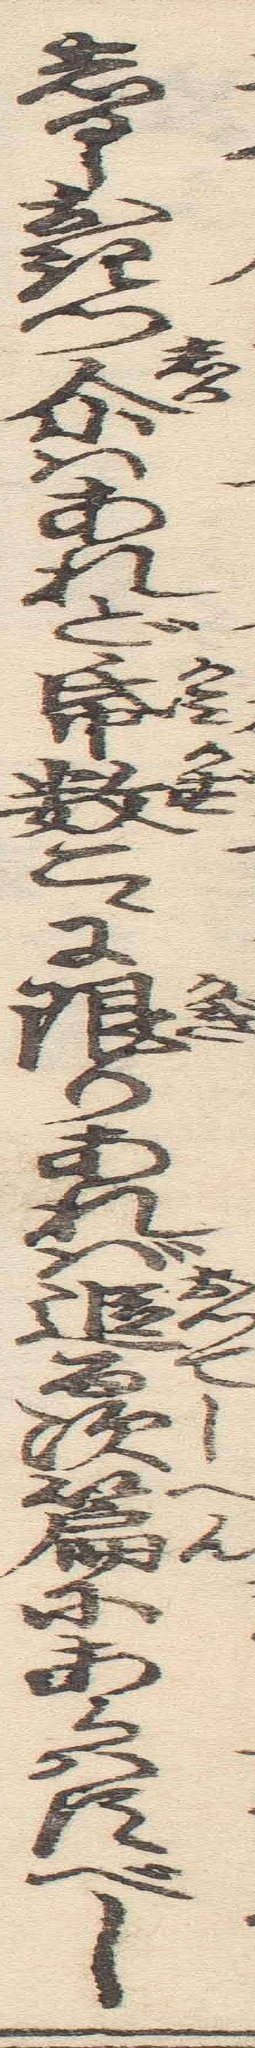しるしおきつ尓はあれど帋数こゝに限りあれば追而次篇にあらはすべし
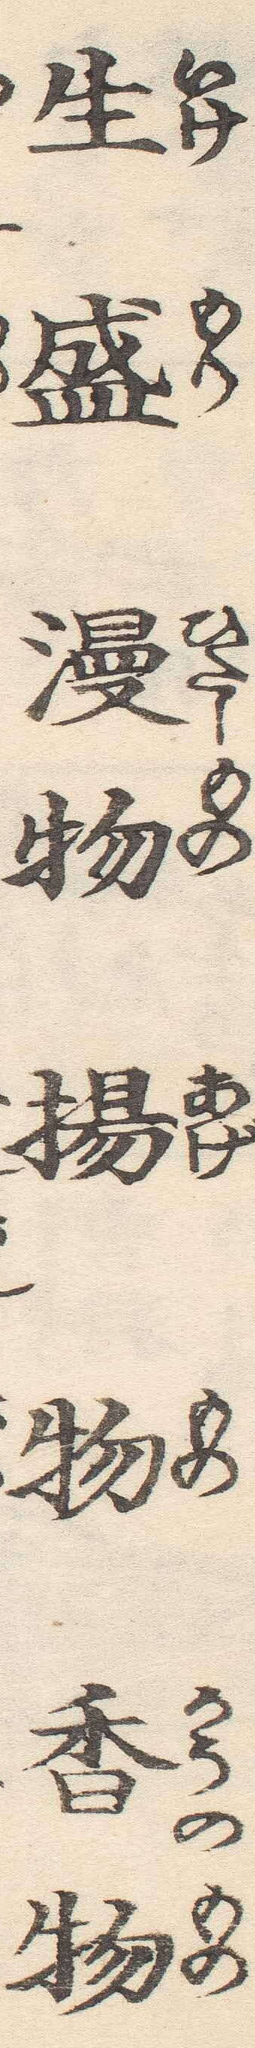生盛漫物揚物香物
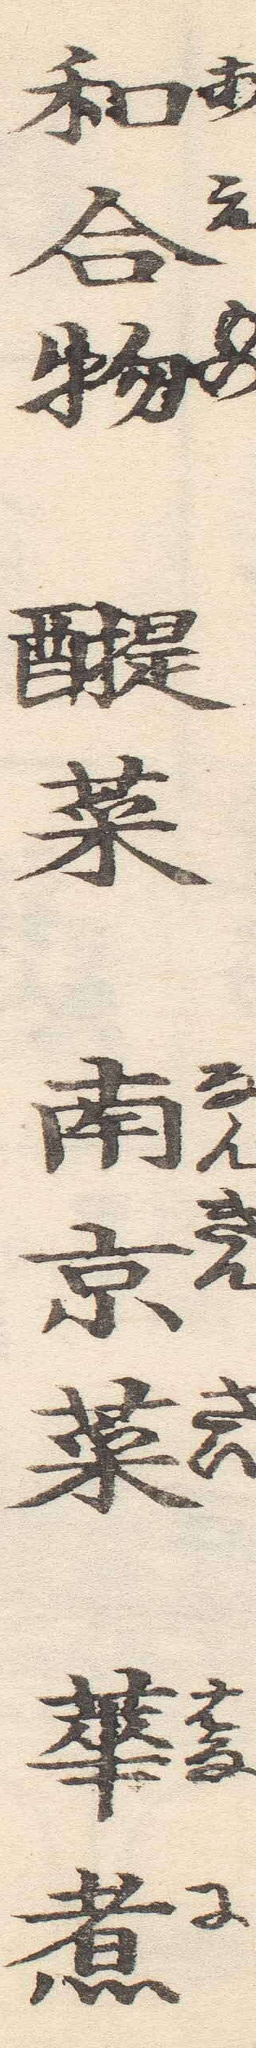和合物菜南京菜華煮
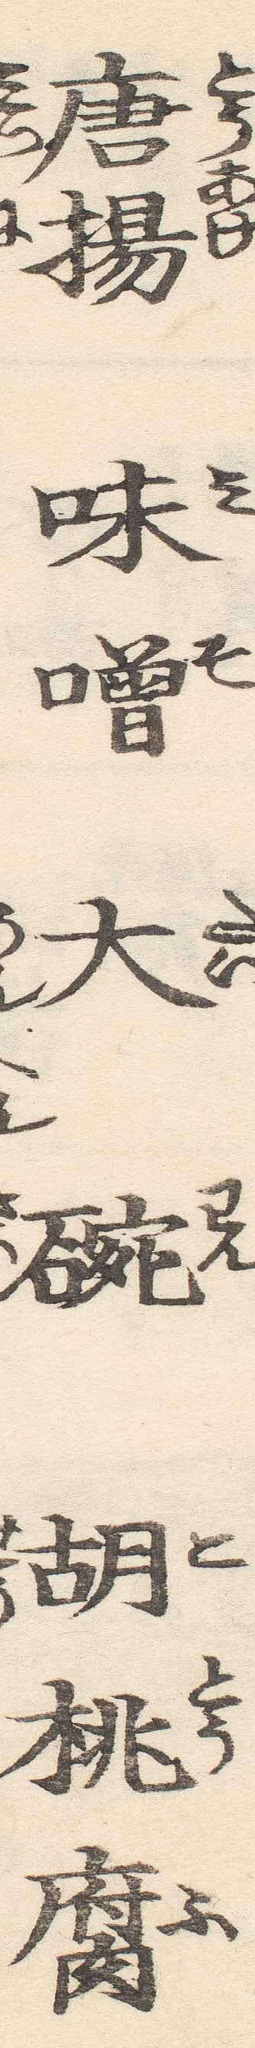唐揚味噌大碗胡桃腐
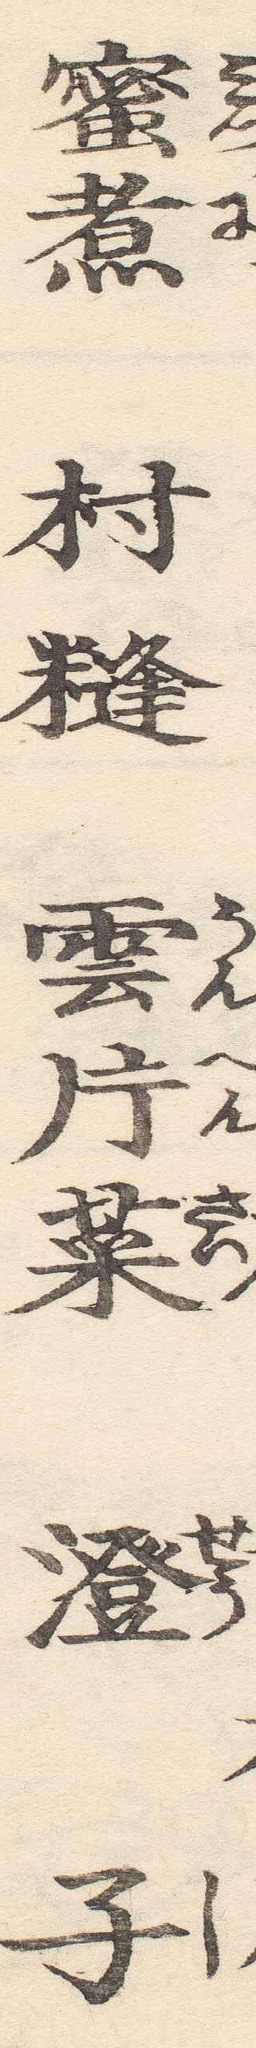蜜煮村雲片菜澄子
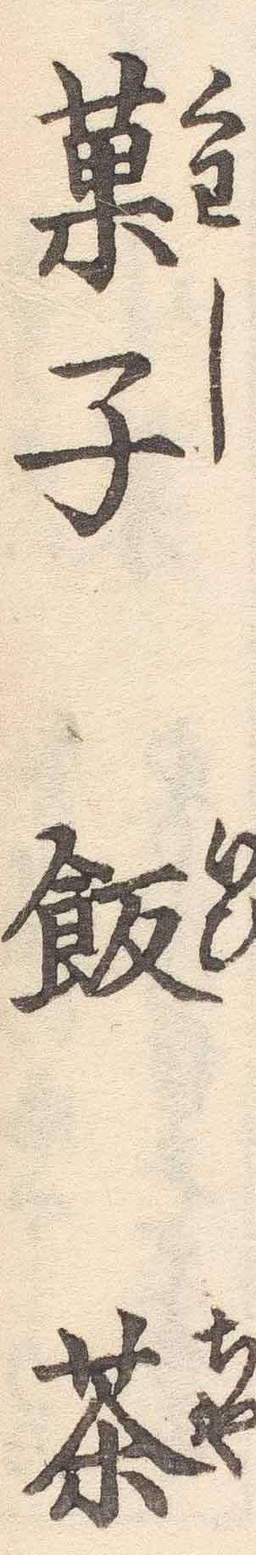菓子飯茶
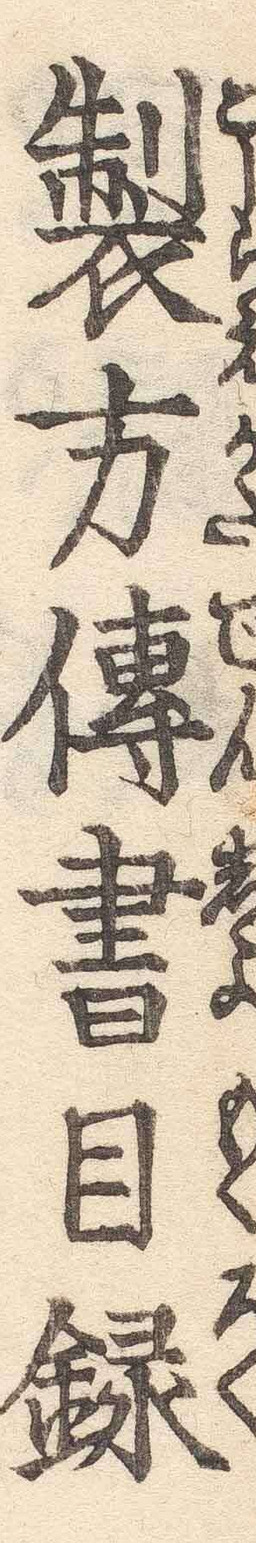製方伝書目録
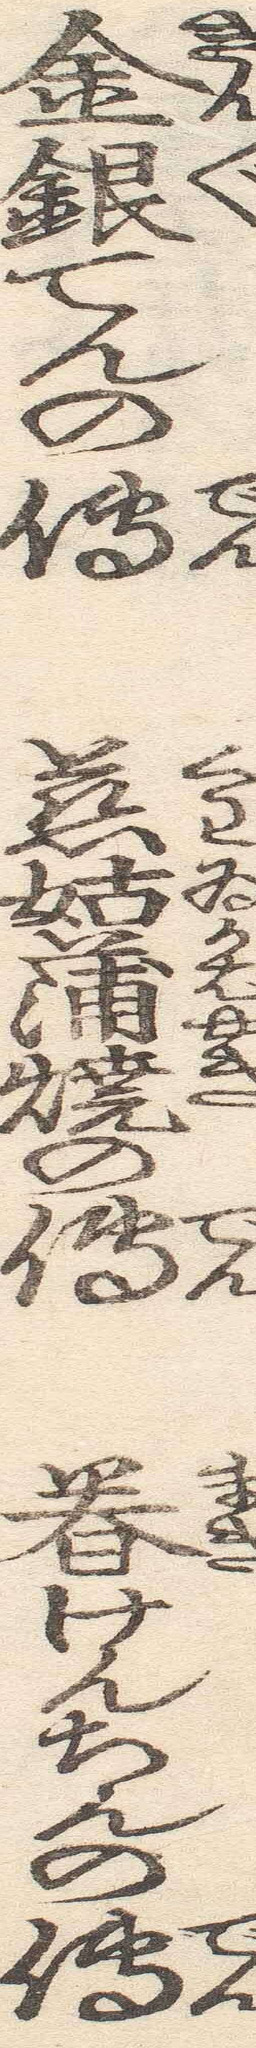金銀てんの伝慈姑蒲焼の伝巻けんちんの伝
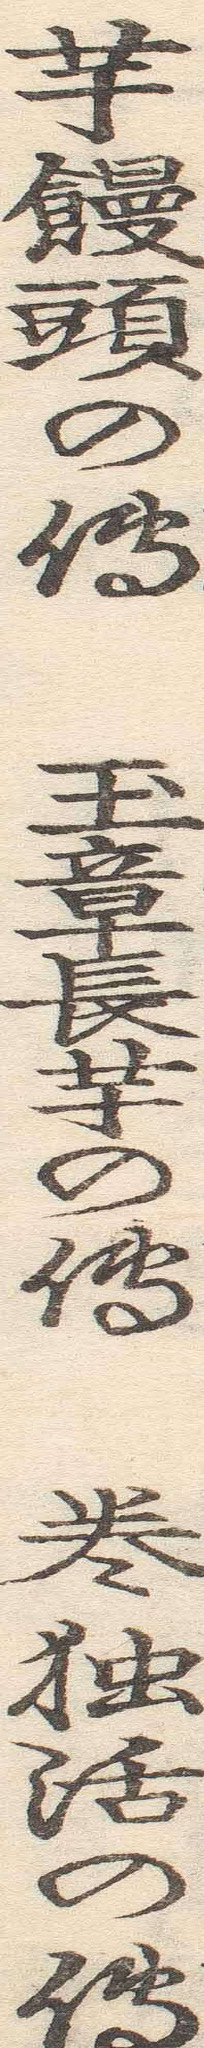芋饅頭の伝玉章長芋の伝巻独活の伝
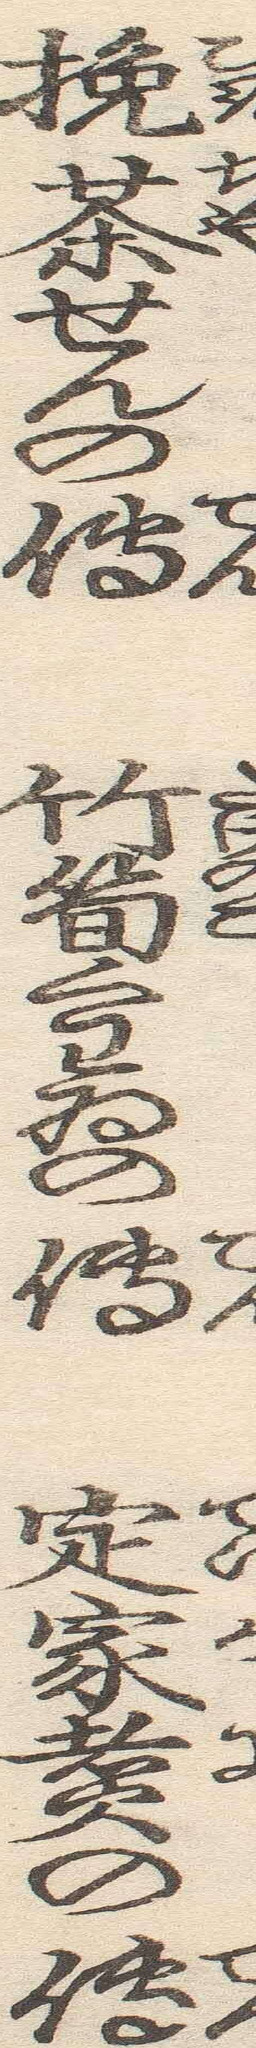挽茶せんの伝竹筍くわゐの伝定家煮の伝
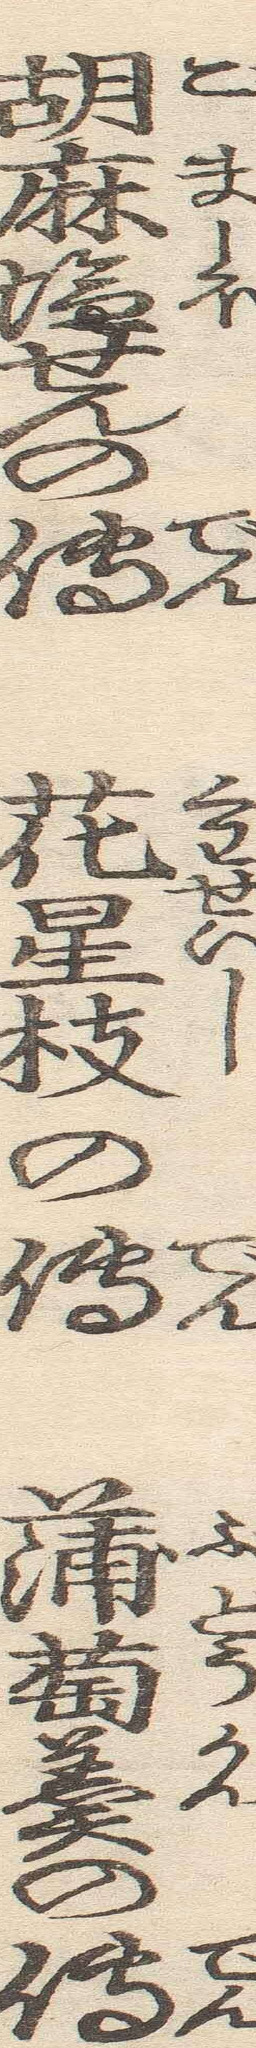胡麻塩せんの伝花星枝の伝蒲萄羹の伝

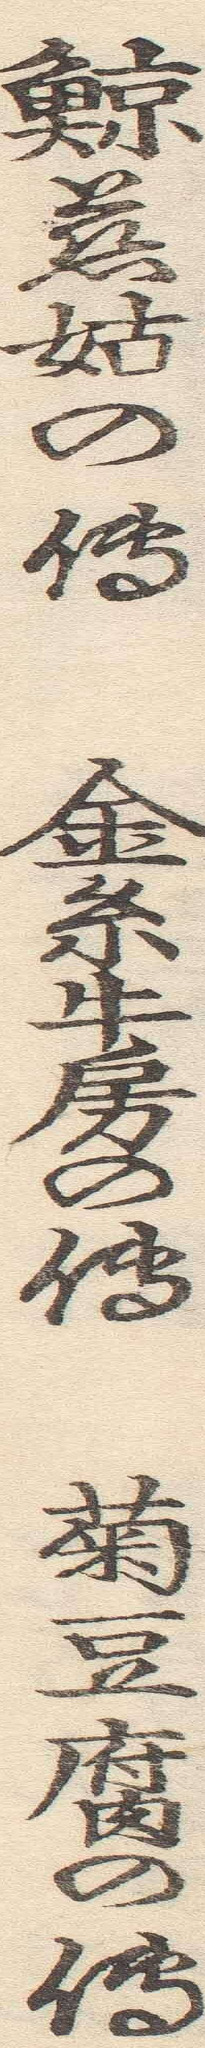鯨慈姑の伝金糸牛蒡の伝菊豆腐の伝
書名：料理通
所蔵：東京学芸大学附属図書館 国文学研究資料館
